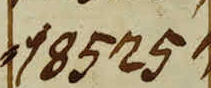18525
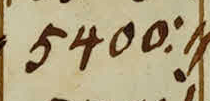5400:
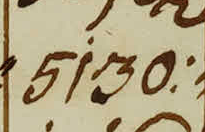5130.
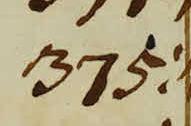375.
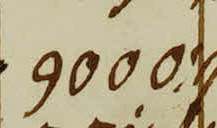9000.
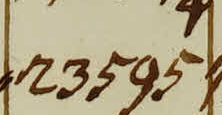23595
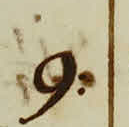9:
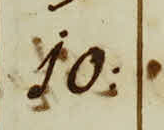10:
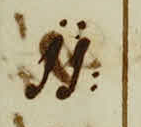11:
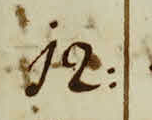12:
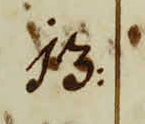13:
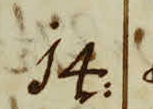14:
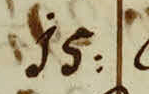15:
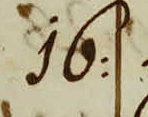16:
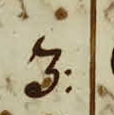3:
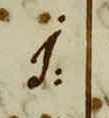1:
